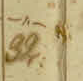32.
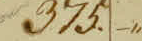375.
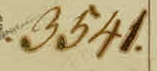3541.
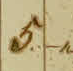5.
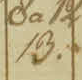13
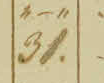31.
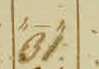31.
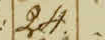24
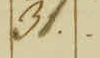31.
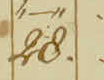28.
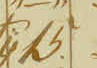15.
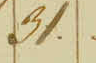31.
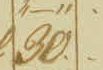30.
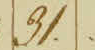31.
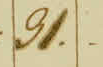31.
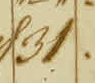31
